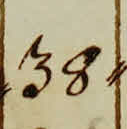38
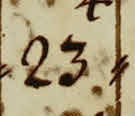23
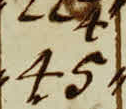45
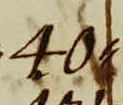40
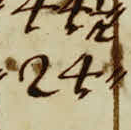24
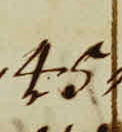45
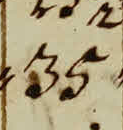35
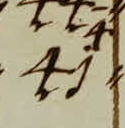41
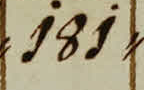181
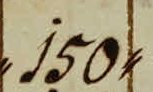150
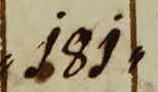181
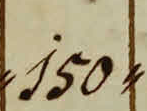150
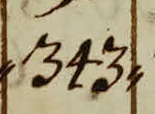343
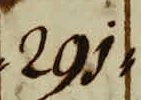291
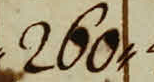260
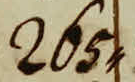265
